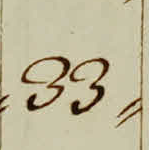33
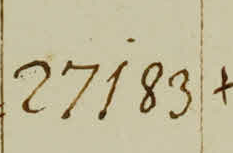27183
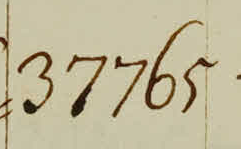37765
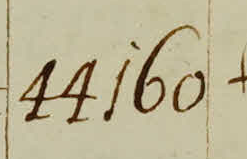44160
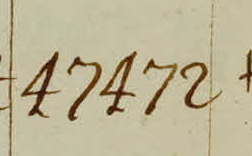47472
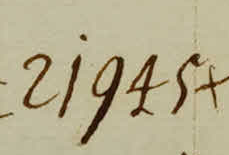21945
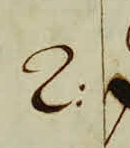2:
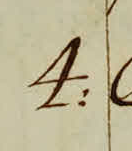4:
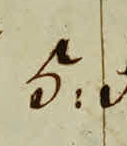5:
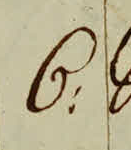6:
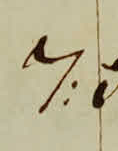7:
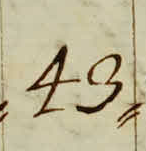43
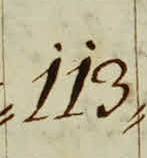113
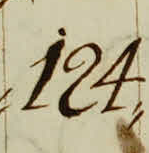124
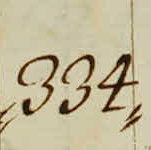334
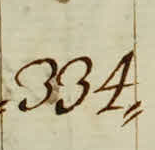334
